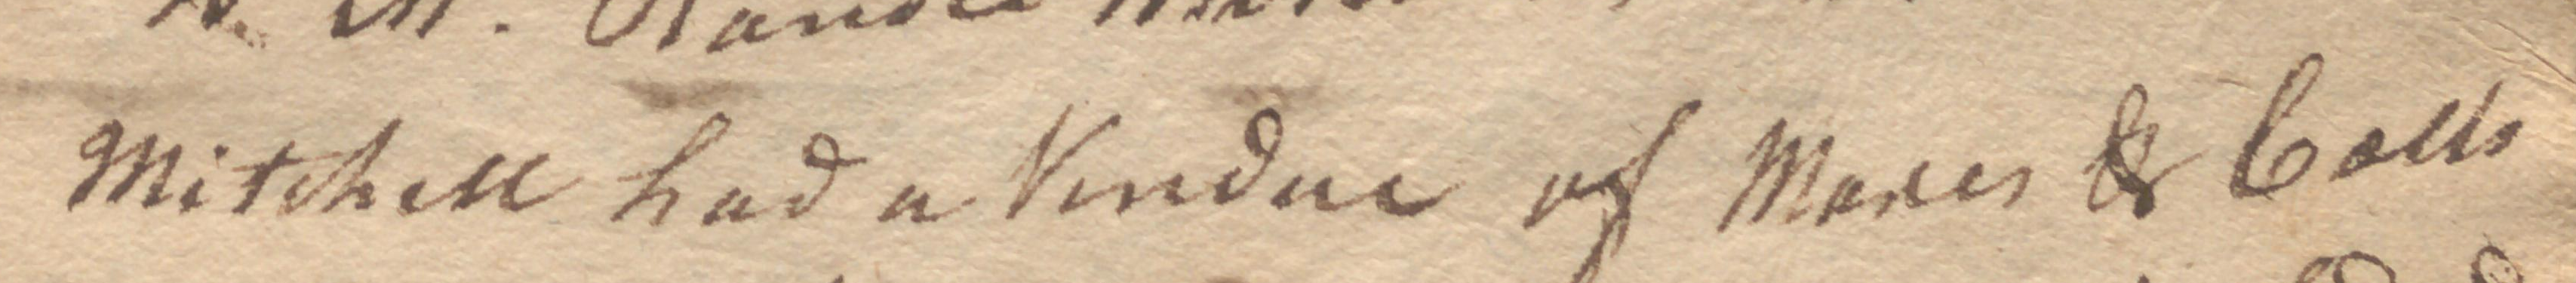Mitchell had a Vendue of Mares & Colts
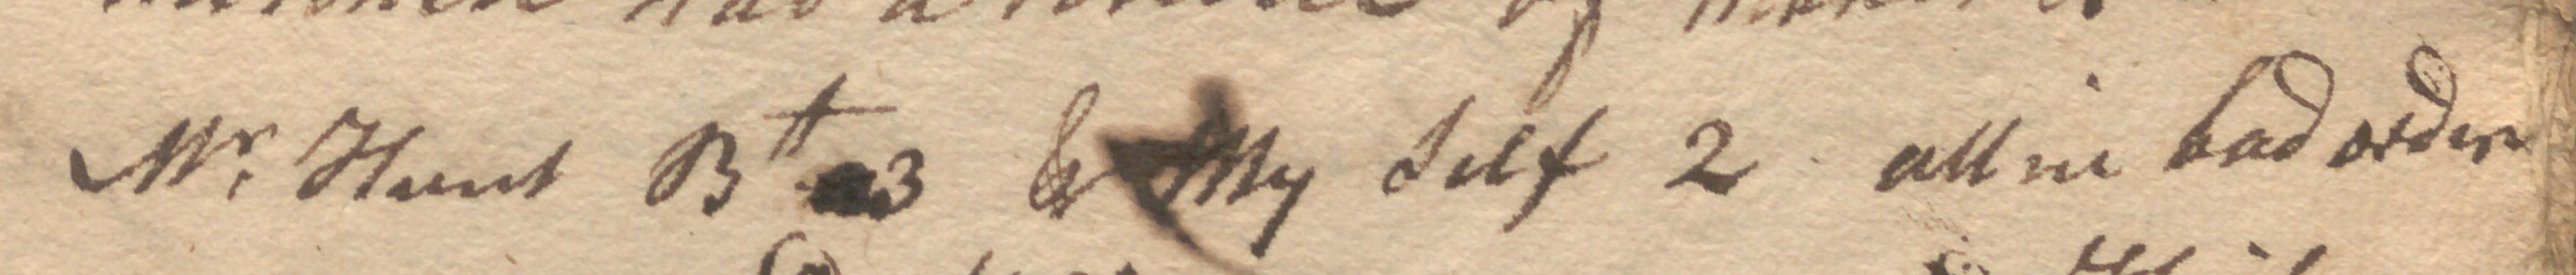M^r. Hunt B^t. 3 & My self 2 all in bad order
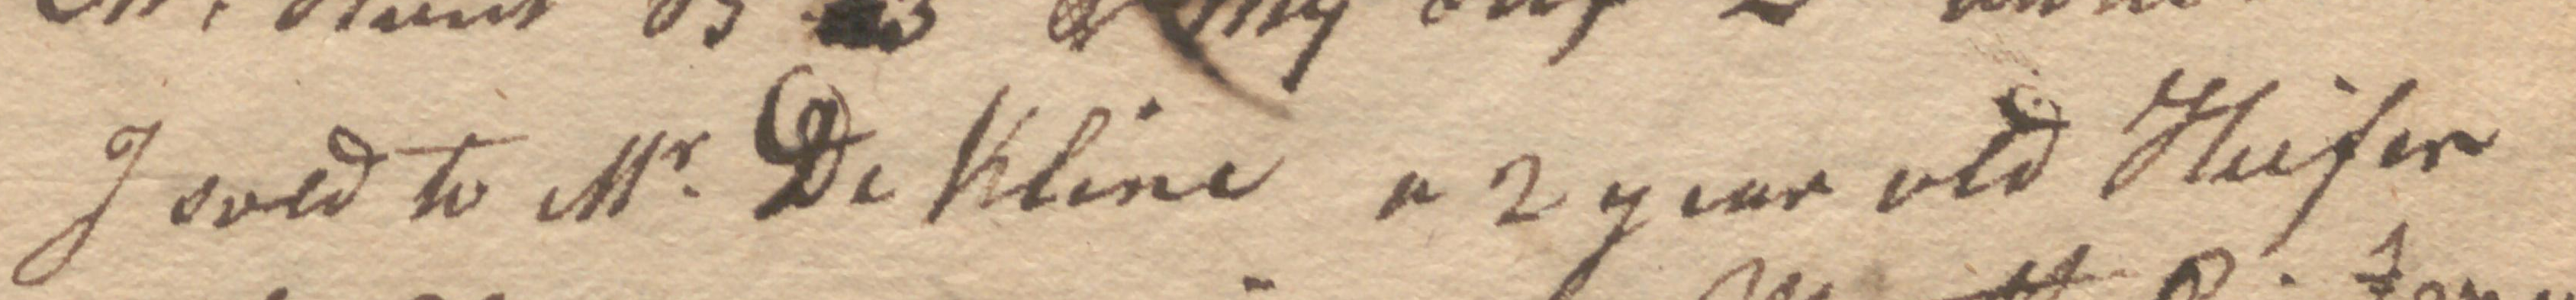I sold to M^r. DeKline a 2 year old Heifer
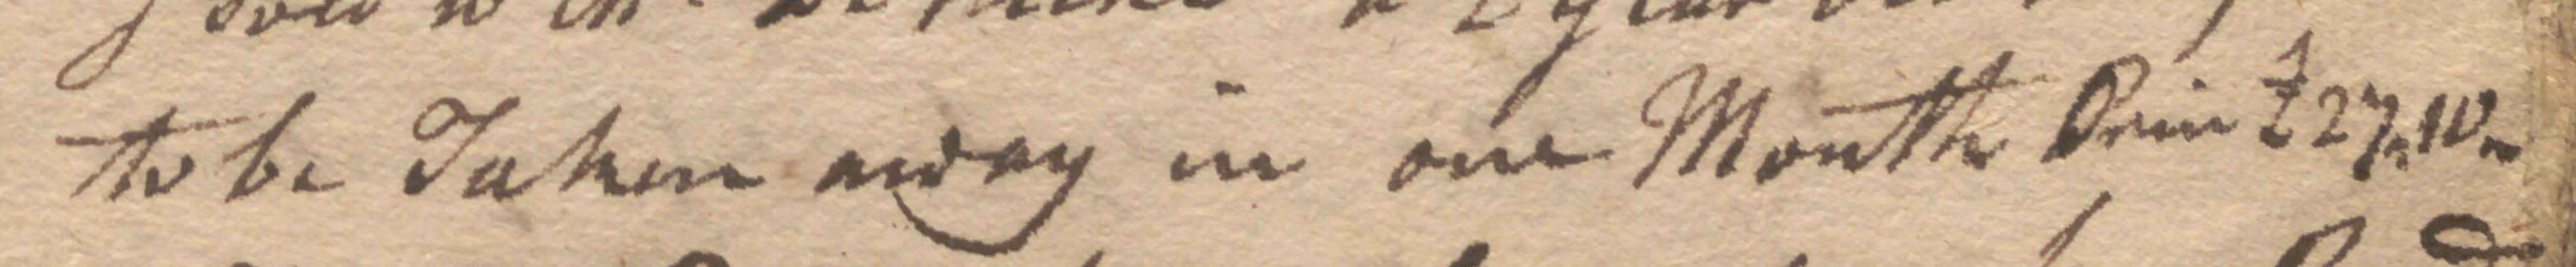to be Taken away in one Month Price £27.10-
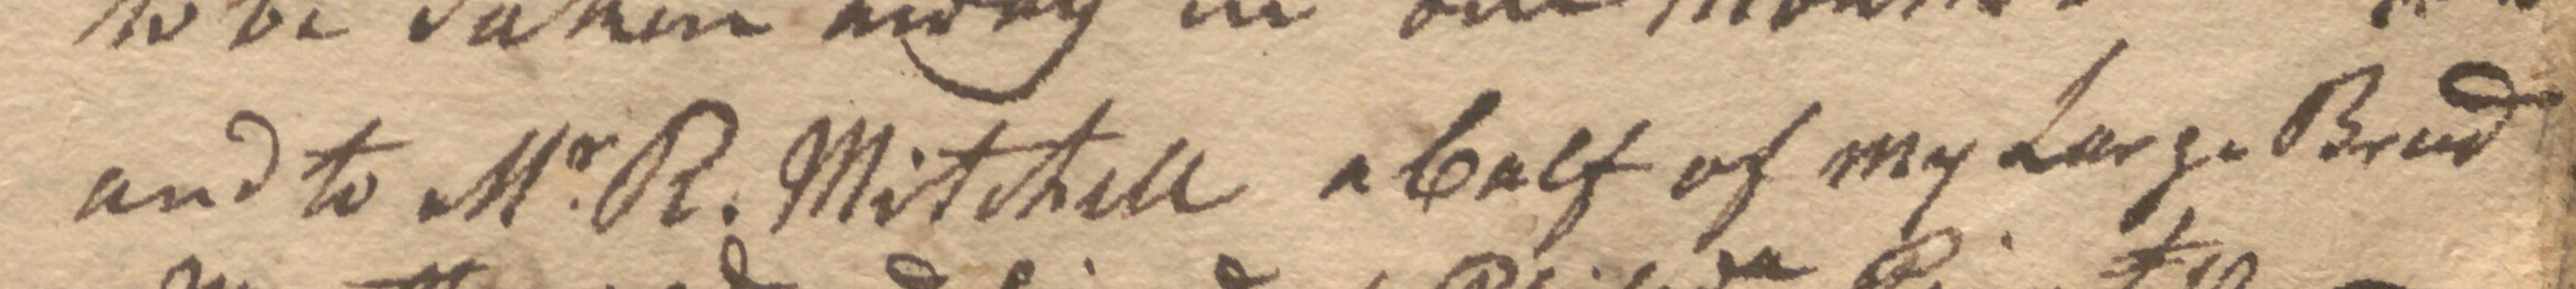and to M^r. R. Mitchell a Calf of my Large Breed
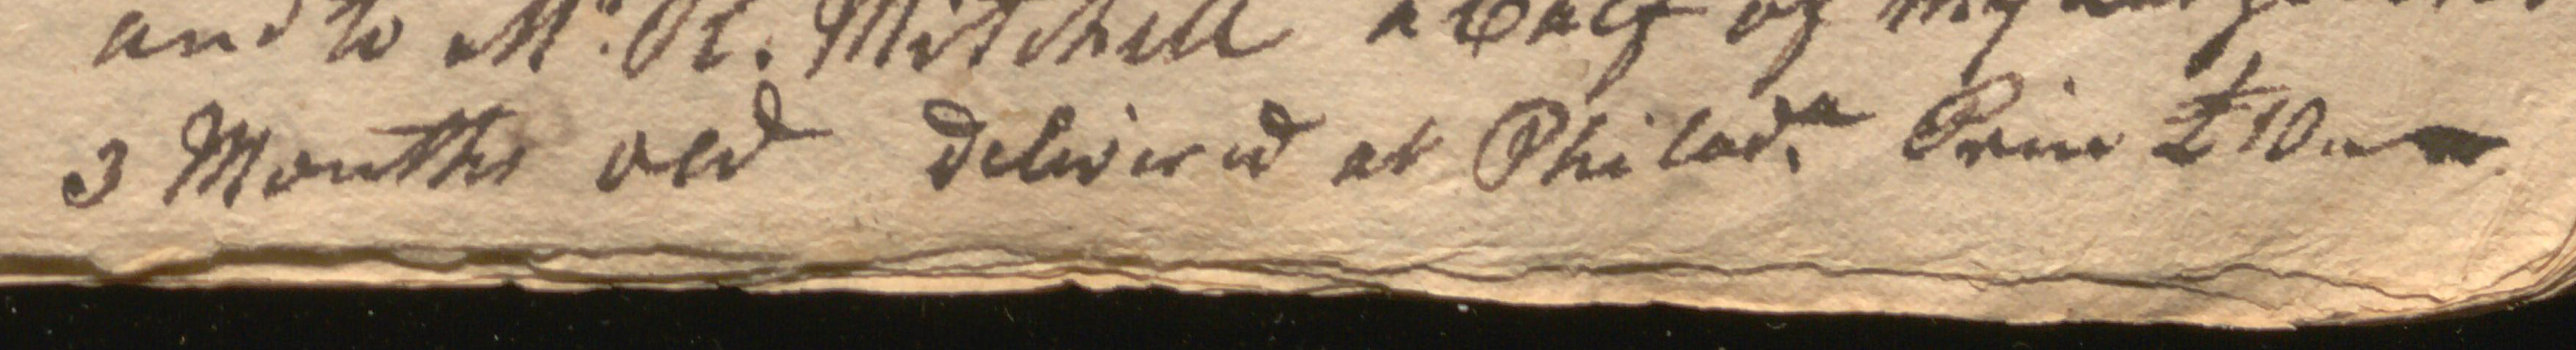3 Months old delivired at Philad^a. Price £10-
